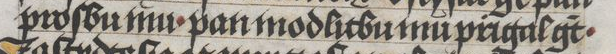proſbu mu.pan modlitbu mu pṙigal ḡt.
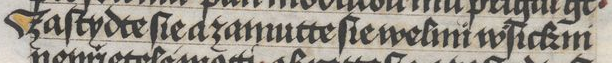Zaſtydte ſie a zarmutte ſie welmi wẛickni
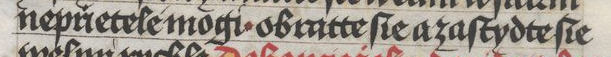nepṙietelé mogi.obratte ſie a zaſtydte ſie
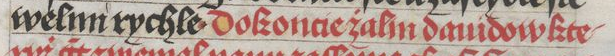welmi rychle.Dokoncíe żalm davidow kte¬
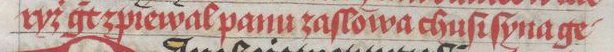ryž ḡt zpiewal panu zaſlowa chuſiſyna ge¬
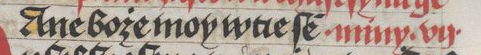Ane boże moy wtie ſe.miny.vij.
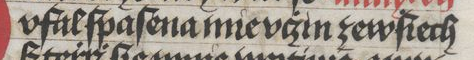uſal ſpaſena mie ucżin zewẛiech
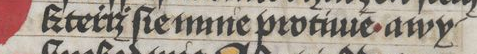kteṙiż ſie mnie protivie.a wy¬
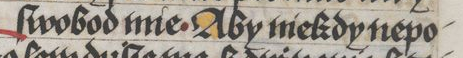ſwobod mie.Aby niekdy nepo¬
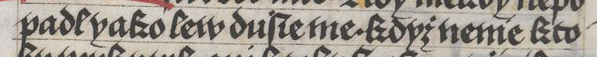padl yako lew duẛie me.kdyż nenie kto¬
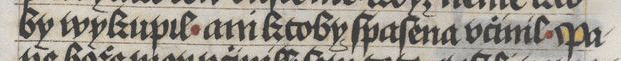by wykupil.ani ktoby ſpaſena uċinil.Pa¬
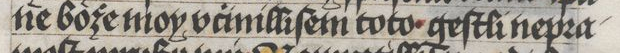ne boże moy uċinilliſem toto.geſtli nepra¬
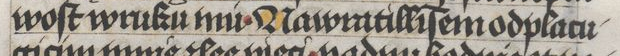woſt wruku mú.Nawratilliſem odplacu¬
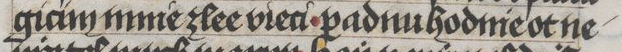gícím mnie zlee vieci.padnu hodnie ot ne¬
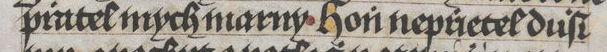pṙatel mych marny.Hoṙi nepṙietel duẛi
